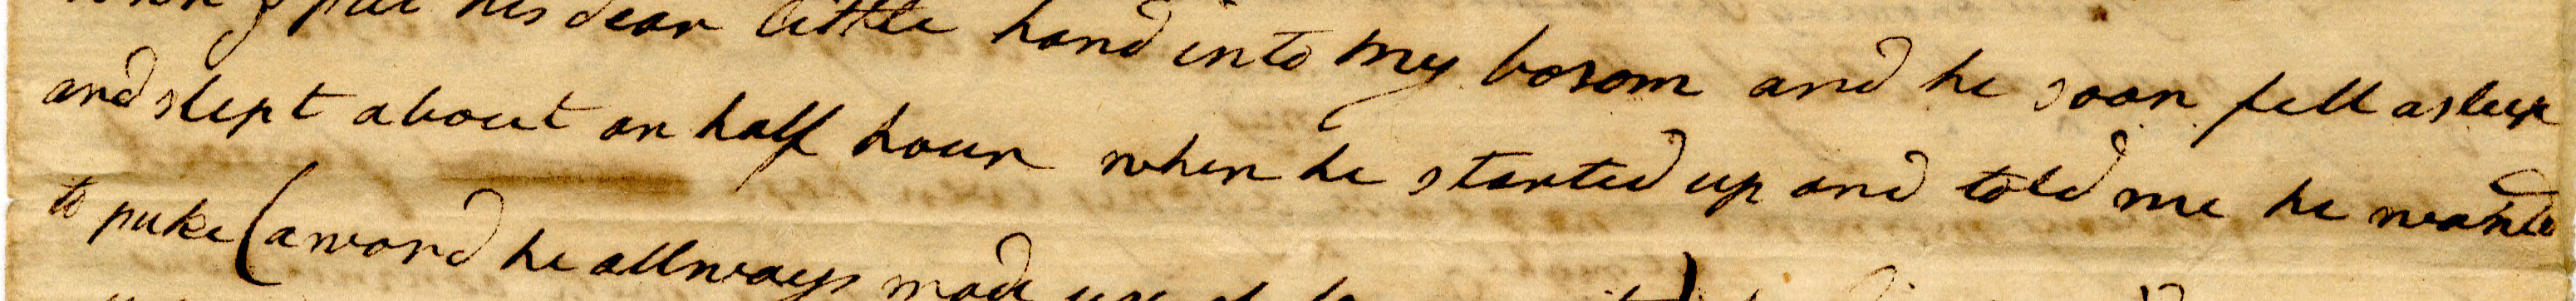and slept about an half hour when he started up and told me he wanted
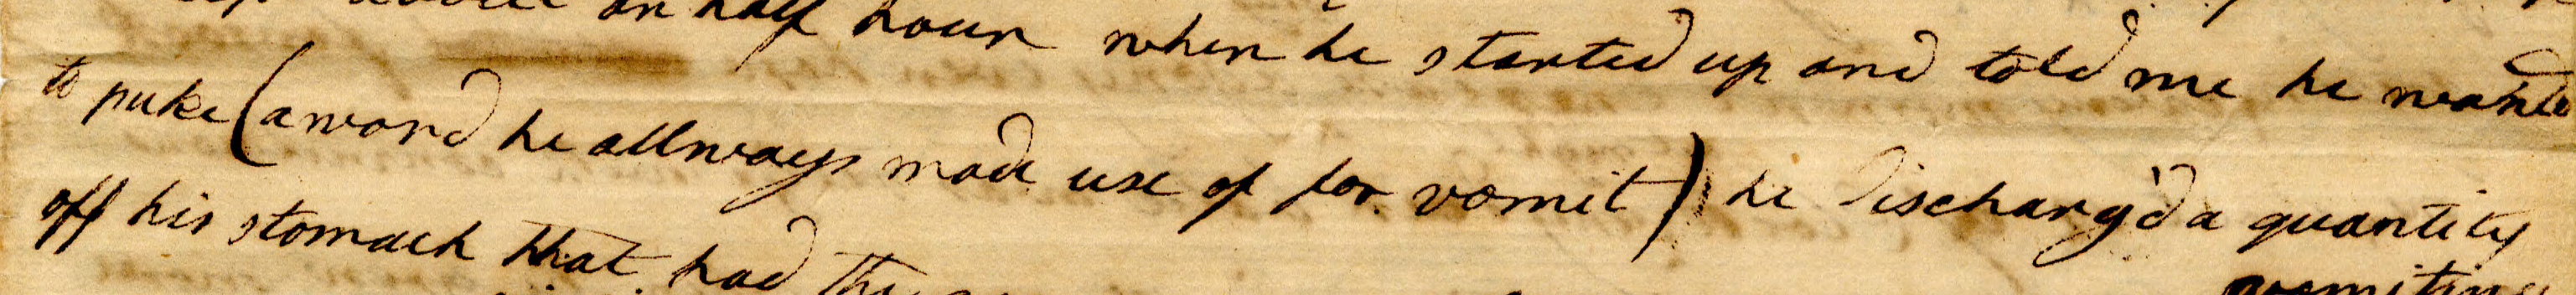to puke (a word he allways made use of for vomit) he discharg'd a quantity
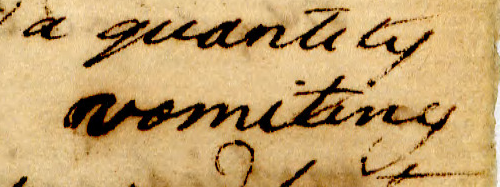vomiting
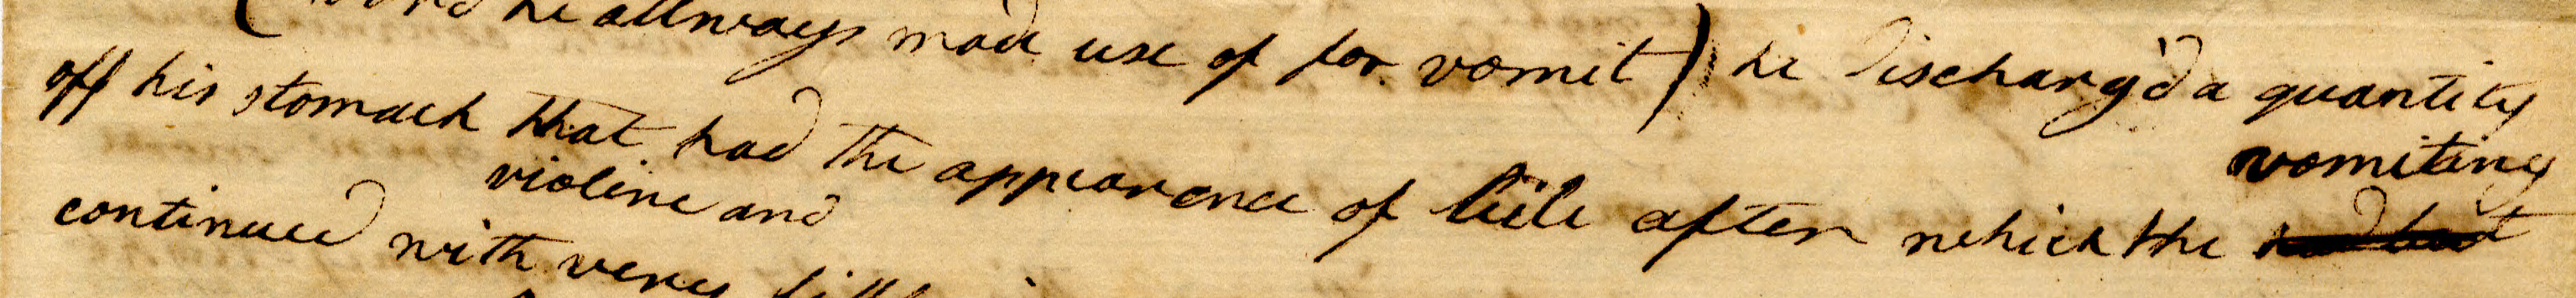off his stomach that had the appearance of bile after which the [need but]
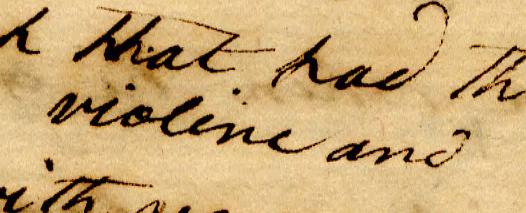violence and
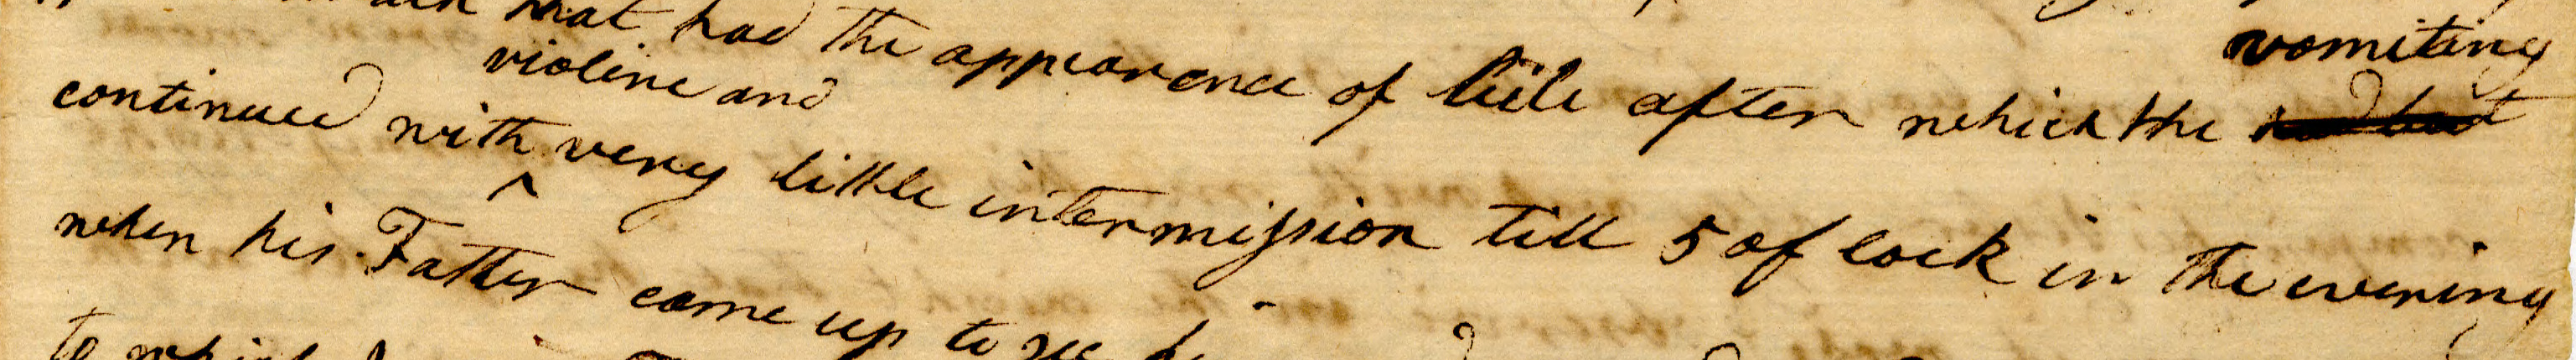continued with ^ very little intermission till 5 oClock in the evening
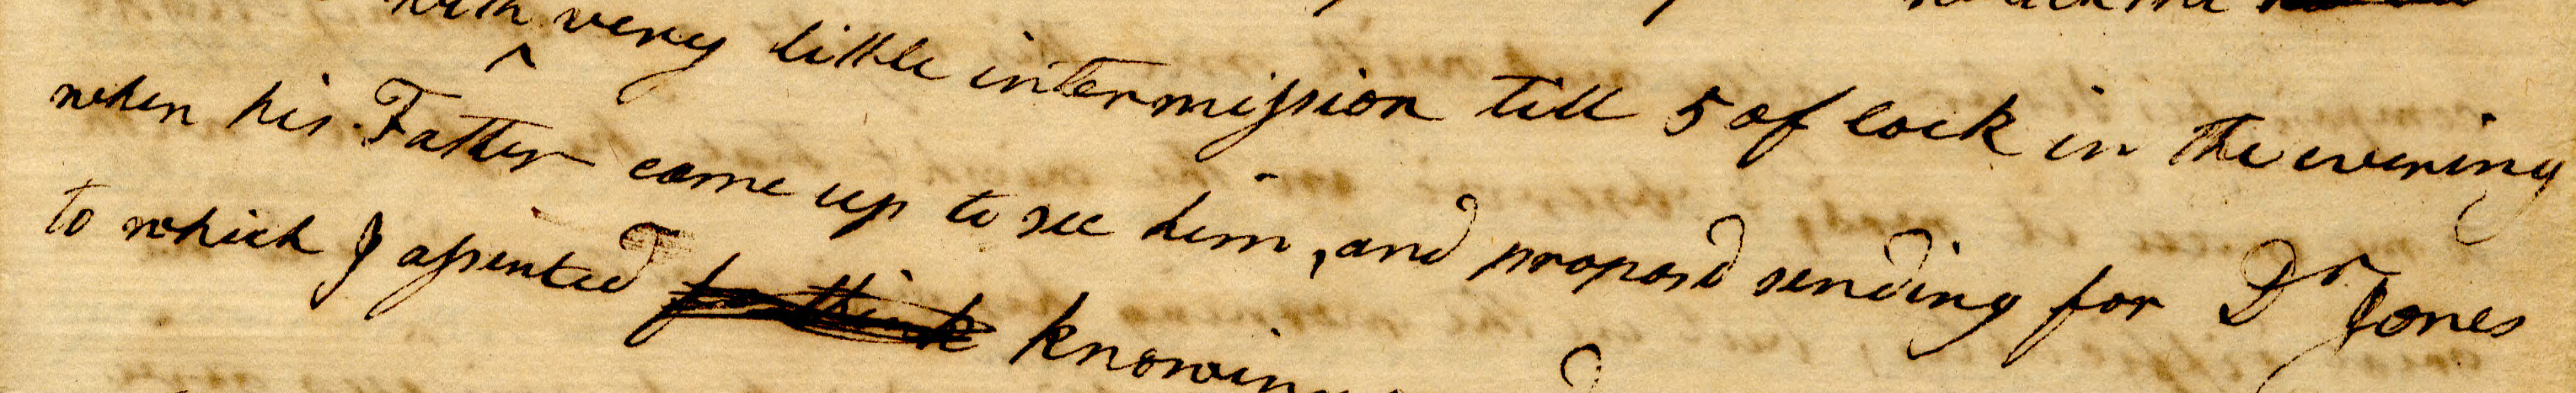when his Father came up to see him, and proposed sending for D^r Jones
